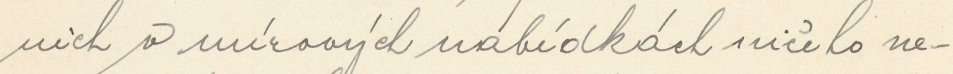nich o mírových nabídkách ničeho ne-
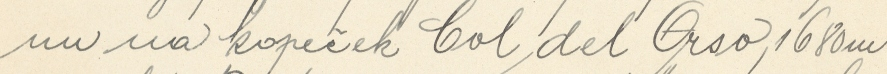nu na kopeček Col del Orso 1680 m
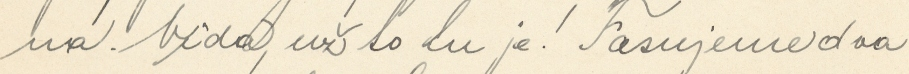ná. Vida, už to tu je! Fasujeme dva
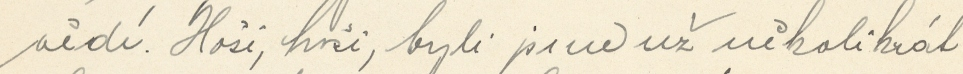vědí. Hoši, hoši, byli jsme už několikrát
